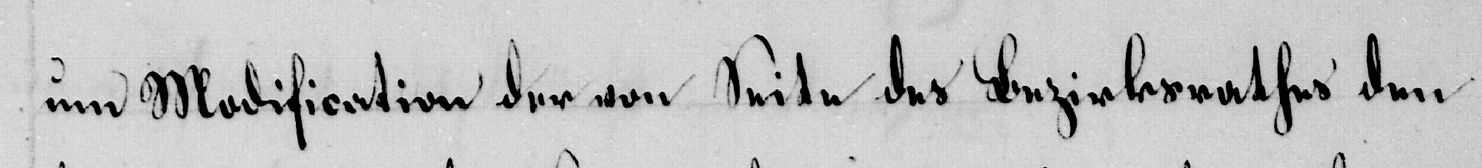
um Modification der von Seite des Bezirksrathes den
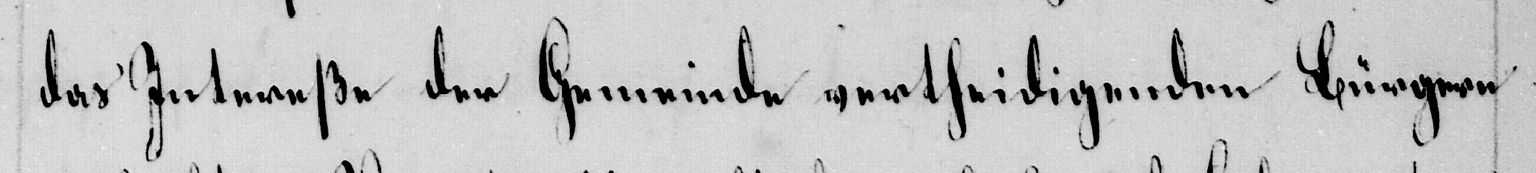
das Intereße der Gemeinde vertheidigenden Bürgern
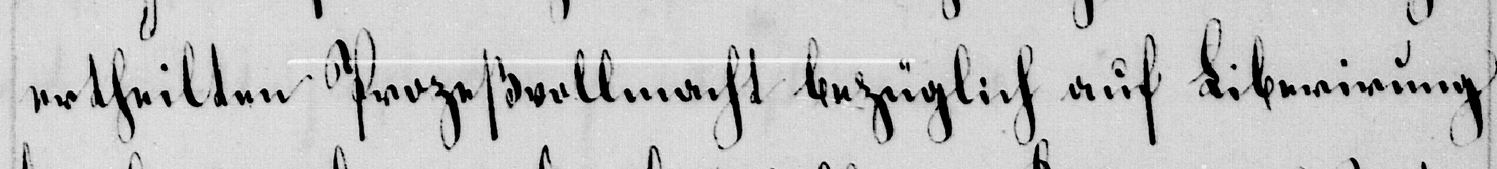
ertheilten Prozeßvollmacht bezüglich auf Libeririung
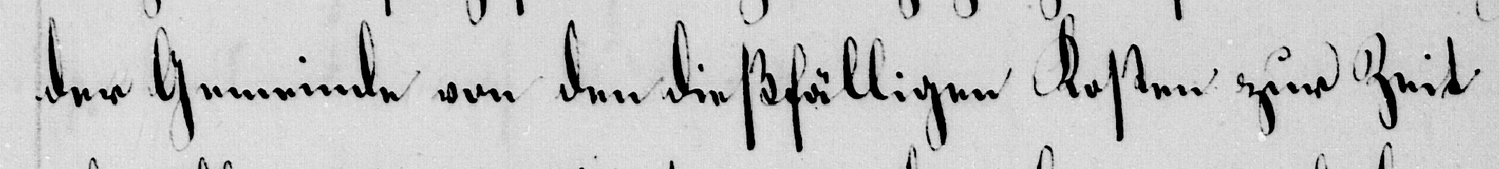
der Gemeinde von den dießfälligen Kosten zur Zeit
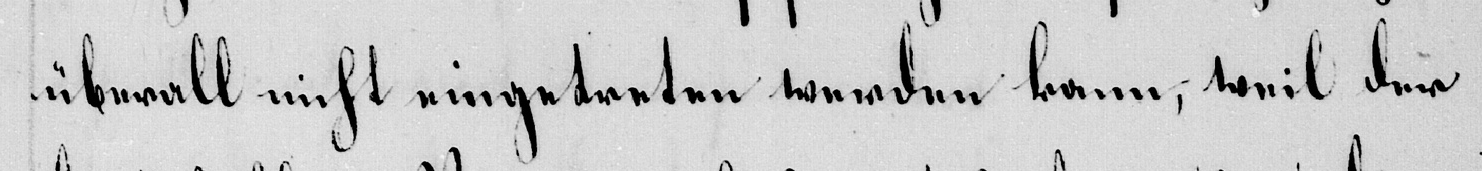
überall nicht eingetreten werden kann, weil der
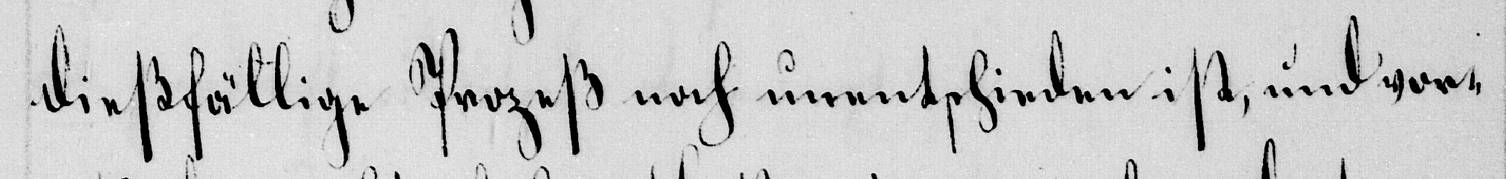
dießfällige Prozeß noch unentschieden ist, und vor¬
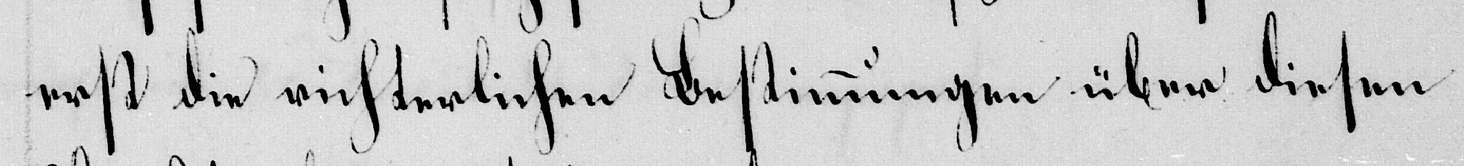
erst die richterlichen Bestimmungen über diesen
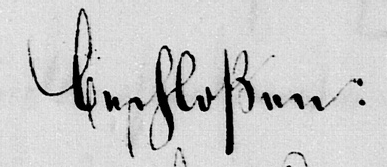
beschloßen:
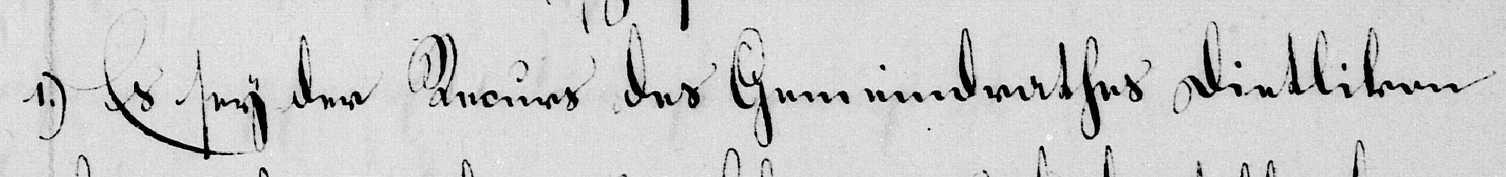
1.) Es sey der Reucrs des Gemeindrathes Dietlikon
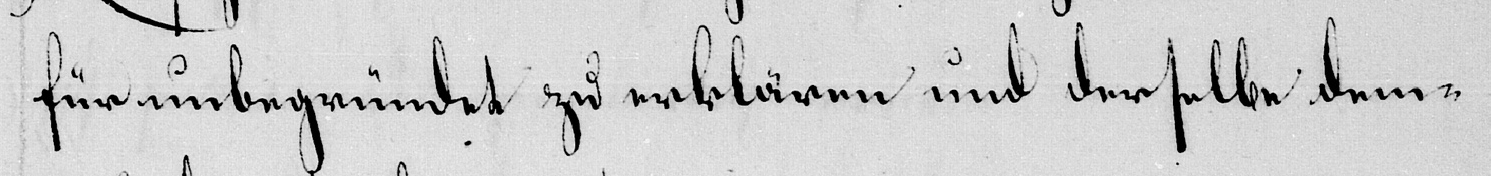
für unbegründet zu erklären und derselbe dem¬
